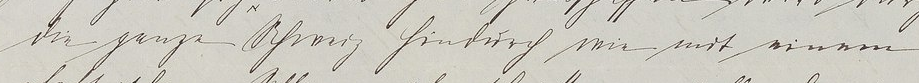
die ganze Schweiz hindurch wie mit einem
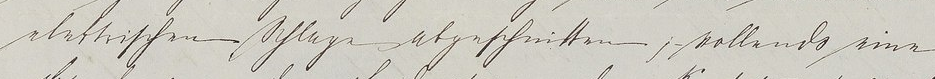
elektrischen Schlage abgeschnitten; – vollends eine
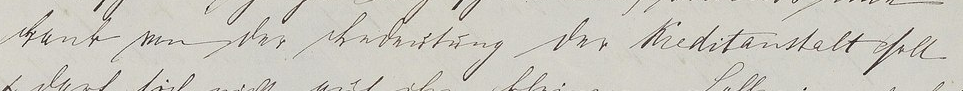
Bank von der Bedeutung der Kreditanstalt soll
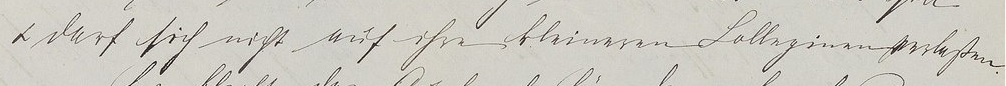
& darf sich nicht auf ihre kleineren Colleginen verlaßen.
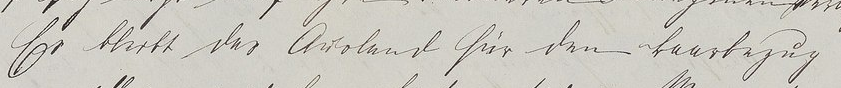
Es bleibt das Ausland für den Baarbezug
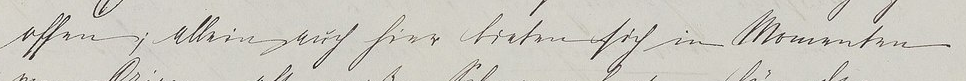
offen; allein auch hier bieten sich in Momenten
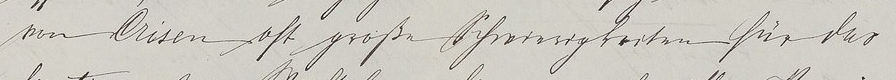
von Crisen oft große Schwierigkeiten für das
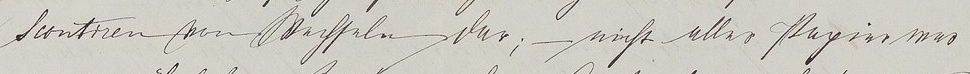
Scontiren von Wechseln dar; – nicht alles Papier was
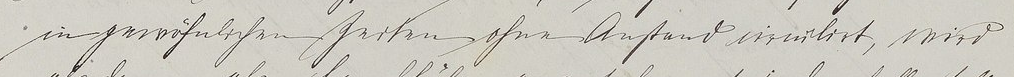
in gewöhnlichen Zeiten ohne Anstand circulirt, wird
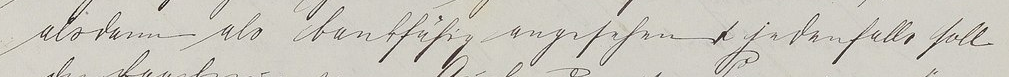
alsdann als bankfähig angesehen & jedenfalls soll
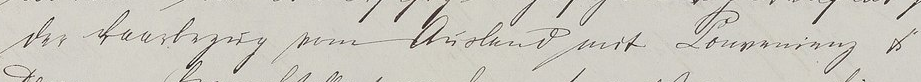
der Baarbezug vom Ausland mit Convenienz &
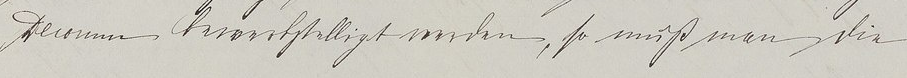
Decorum bewerkstelligt werden, so muß man die
